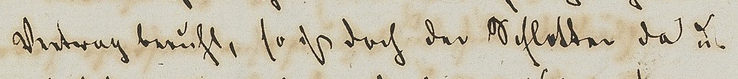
Vertrag beruht, so ist doch der Schlotter da u.
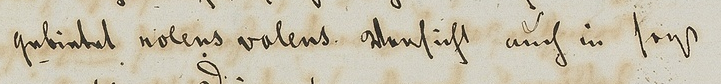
gebietet nolens volens Vorsicht auch in sonst
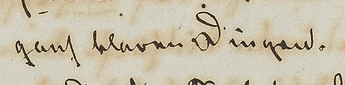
ganz klaren Dingen.
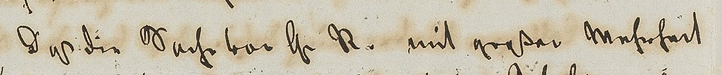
Daß die Sache vor GrR. mit großer Mehrheit
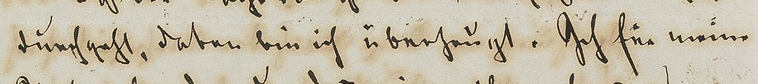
durchgeht, davon bin ich überzeugt. Ich für meine
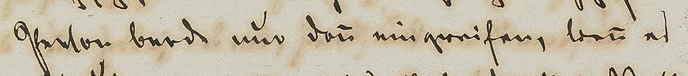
Person werde nur dann eingreifen, wenn es
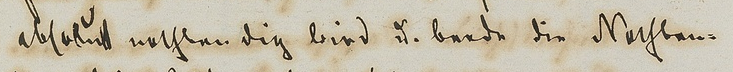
absolut nothwendig wird u. werde die Nothwen-
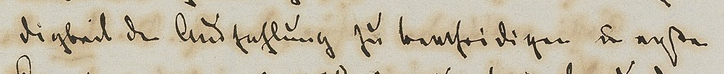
digkeit der Auszahlung zu vertheidigen in erster
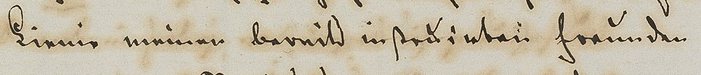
Linie meinen bereits instruirten Freunden
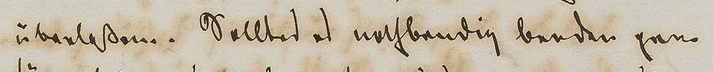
überlaßen. Sollte es nothwendig werden per-
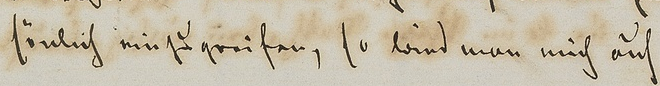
sönlich einzugreifen, so wird man mich auf
